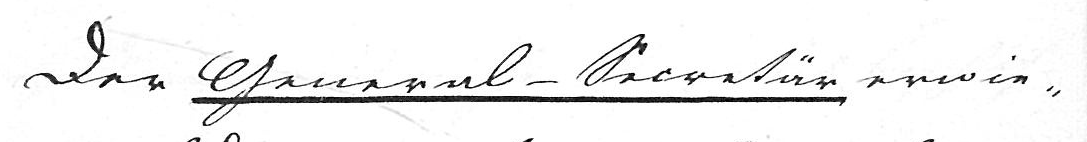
Der General-Secretär erwie-
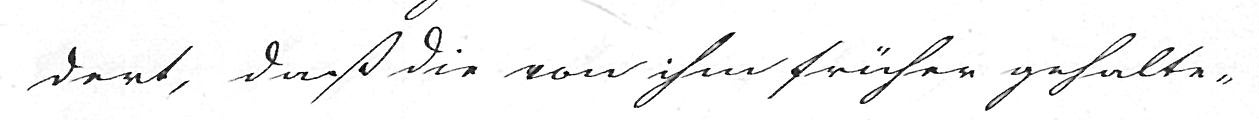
dert, daß die von ihm früher gehalte-
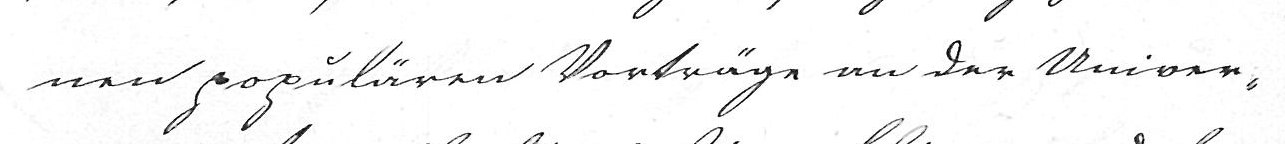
nen populären Vorträge an der Univer-
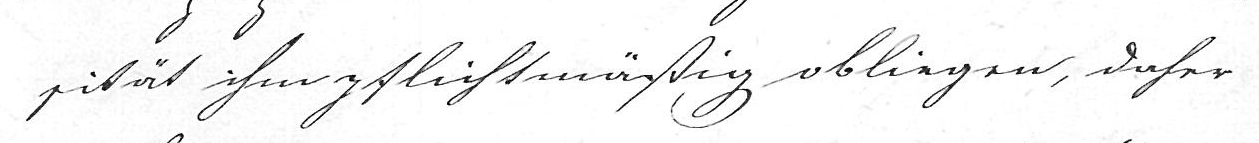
sität ihm pflichtmäßig obliegen, daher
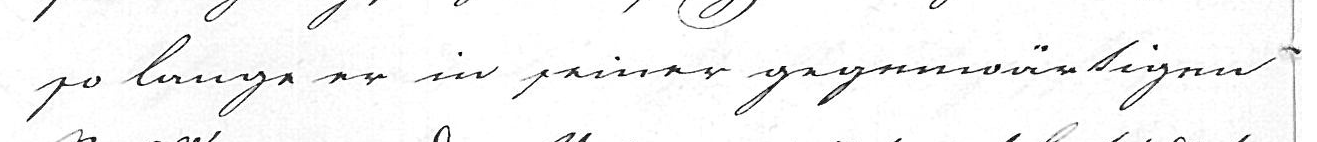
so lange er in seiner gegenwärtigen
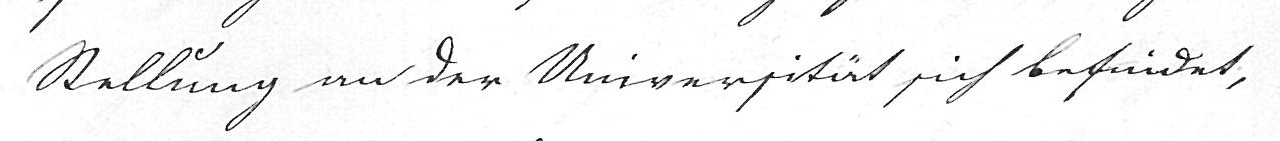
Stellung an der Universität sich befindet,
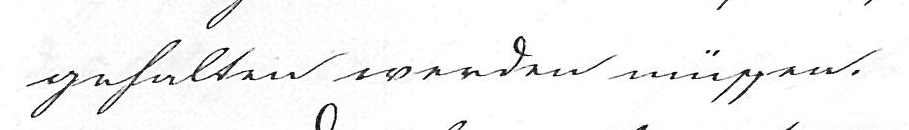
gehalten werden müssen.
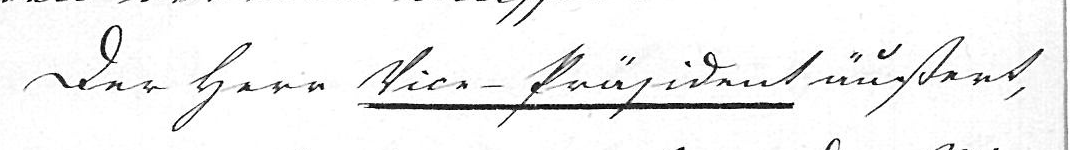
Der Herr Vice-Präsident äußert,
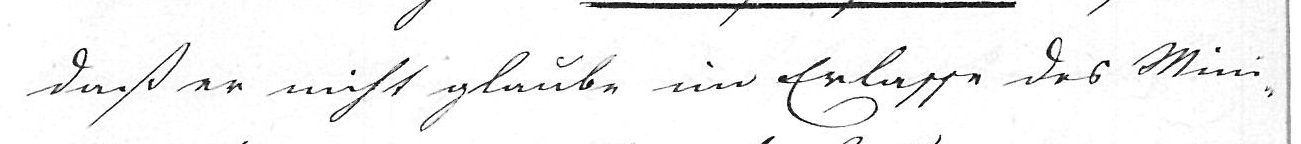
daß er nicht glaube im Erlasse des Mini-
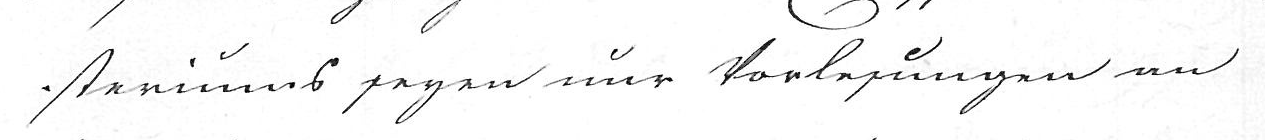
steriums seyen nur Vorlesungen an
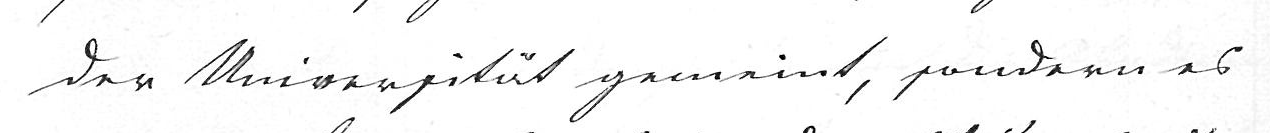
der Universität gemeint, sondern es
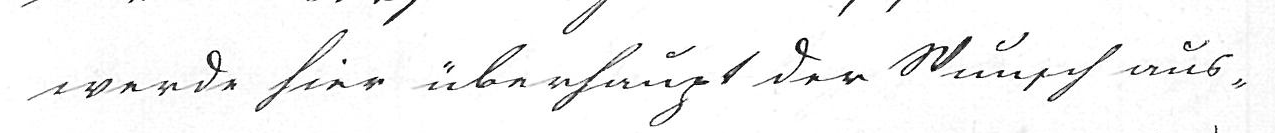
werde hier überhaupt der Wunsch aus-
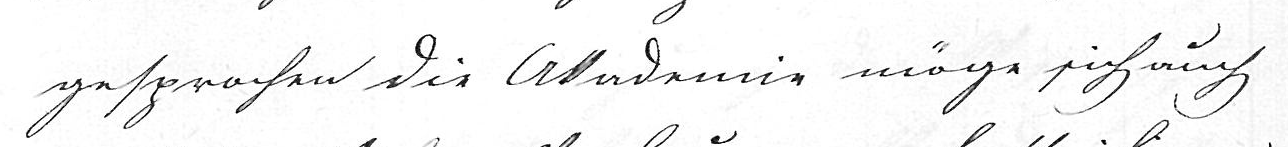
gesprochen die Akademie möge sich auch
